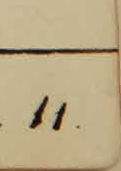11.
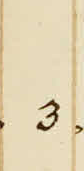3
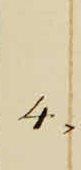4
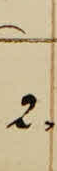2
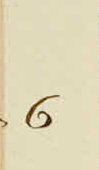6
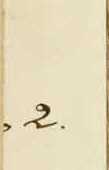2.
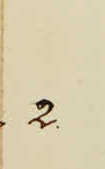2.
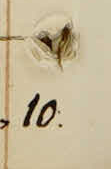10.
